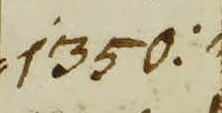1350.
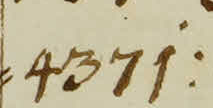4371
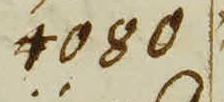4080
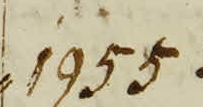1955
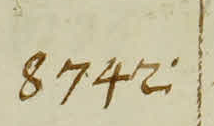8742:
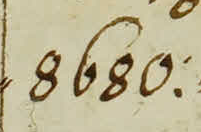8680
